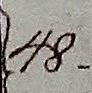48
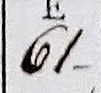61
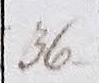36
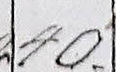40
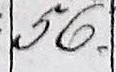56
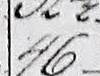46
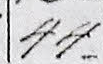44
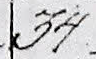34
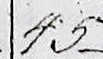45
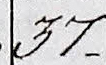37
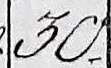30
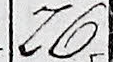26
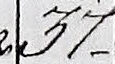37
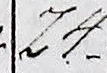24
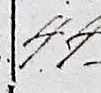44
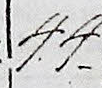44
